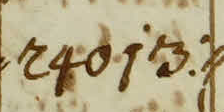24013.
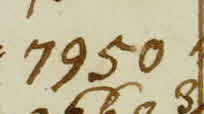7950
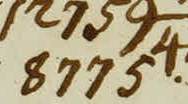8775
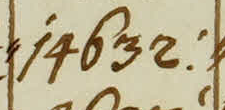14632.
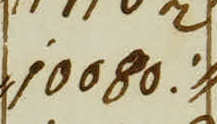10080.
